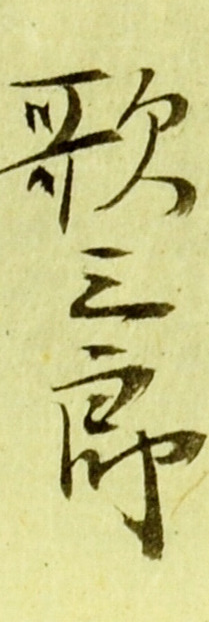歌三郎
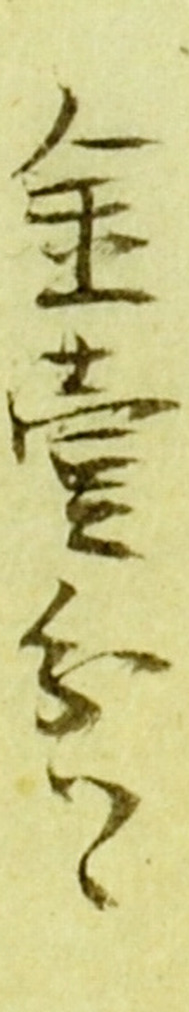金壱分亀治
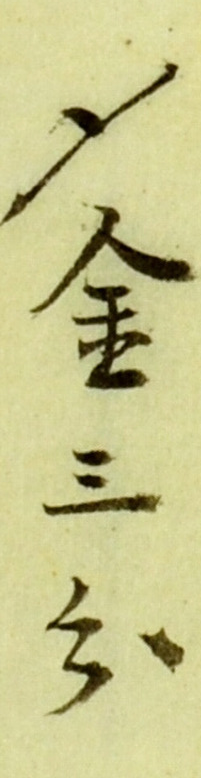〆金三分
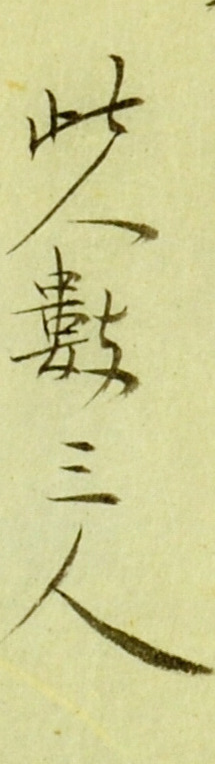此人数三人

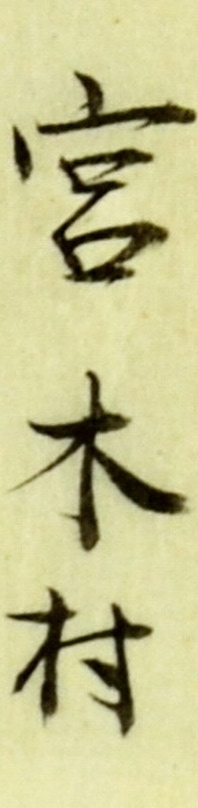宮木村
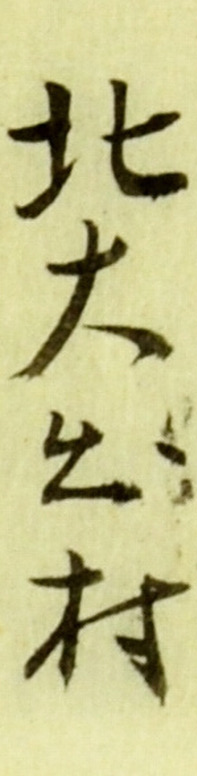北大出村
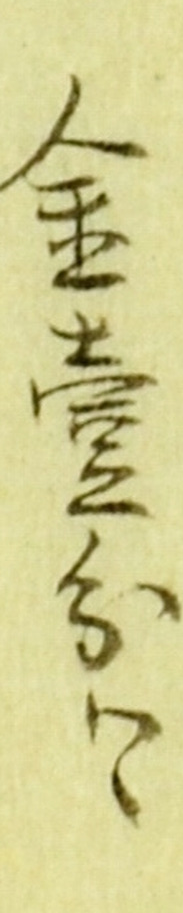金壱分友弥
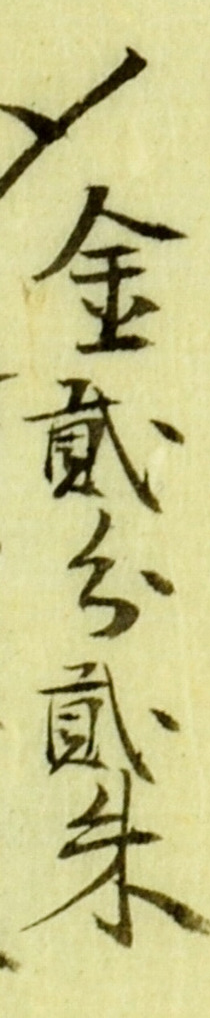〆金弐分弐朱
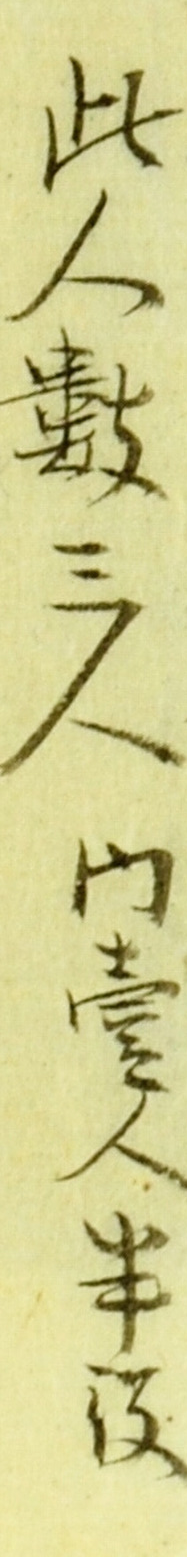此人数参人内壱人半役
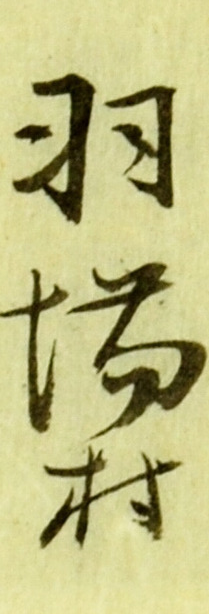羽場村
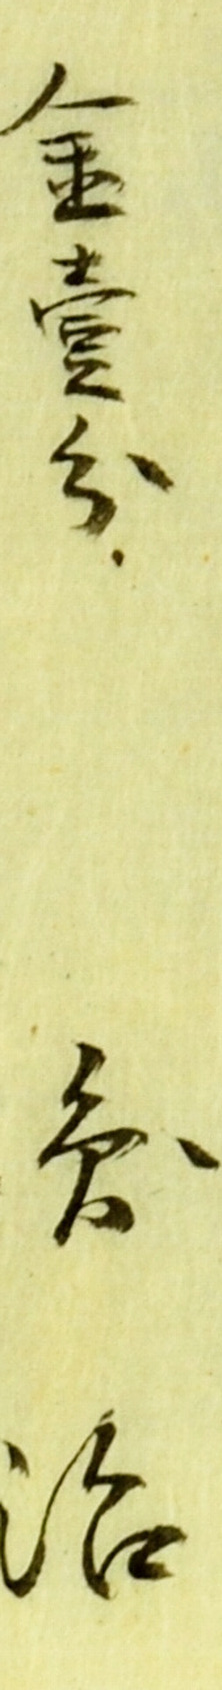金壱分圓治
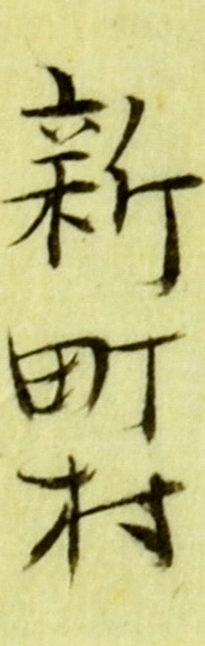新町村
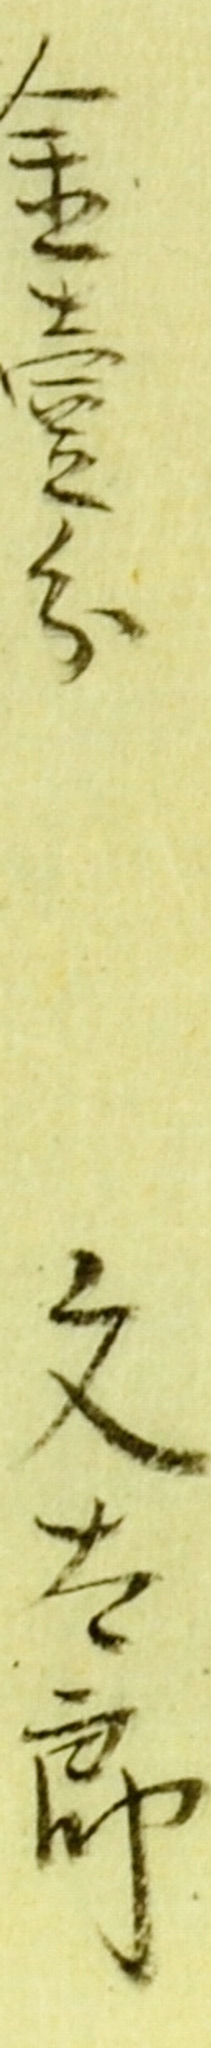金壱分文太郎
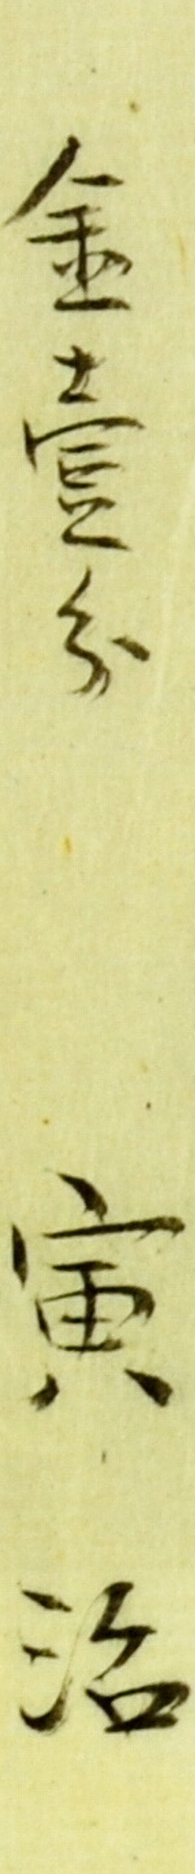金壱分寅治

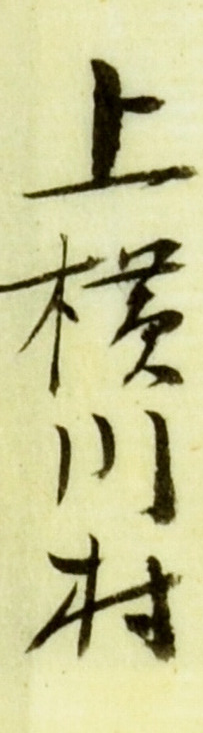上横川村
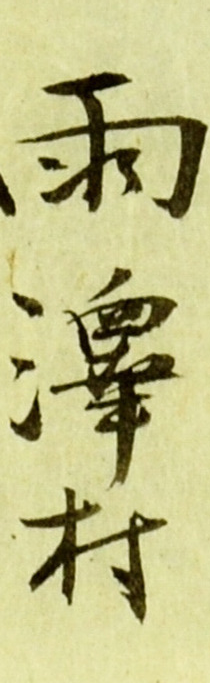雨沢村
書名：上伊那郷諸運上取調帳
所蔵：伊那市立高遠町図書館・合同会社AMANE
